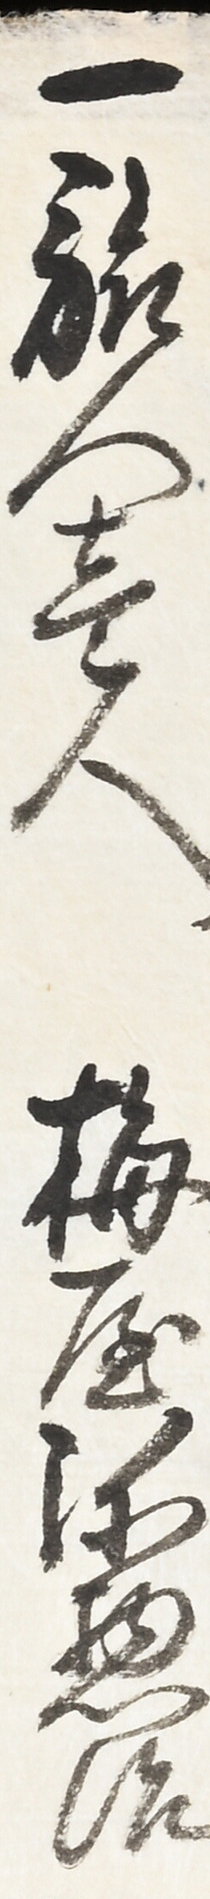壱旅人壱人梅屋弥惣治
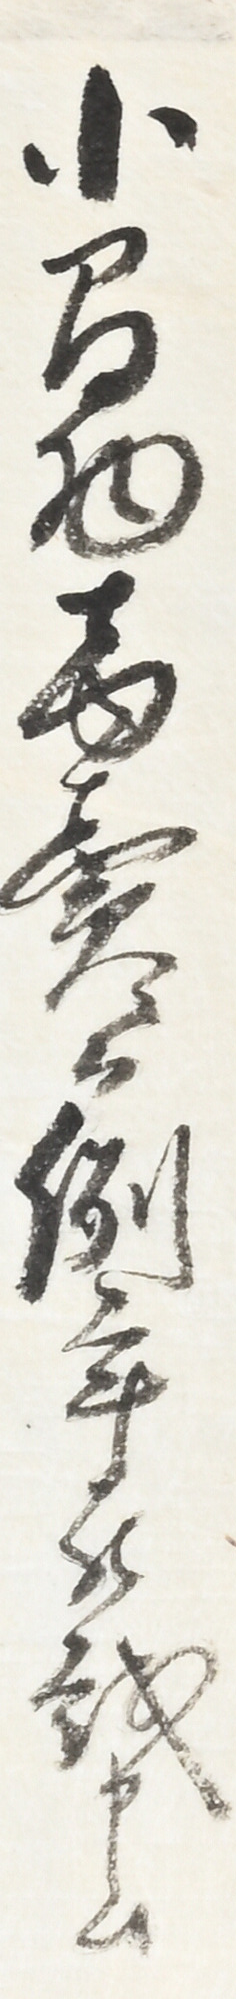小間物商売ニ而例年罷越申候
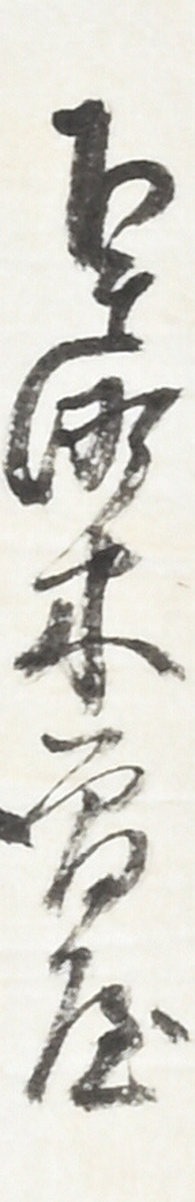下モ町木曽屋
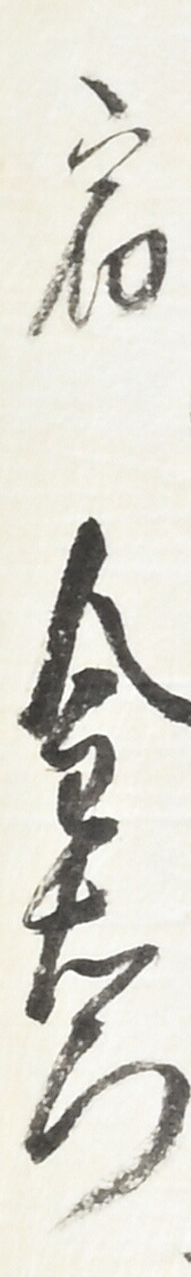宿金右衛門
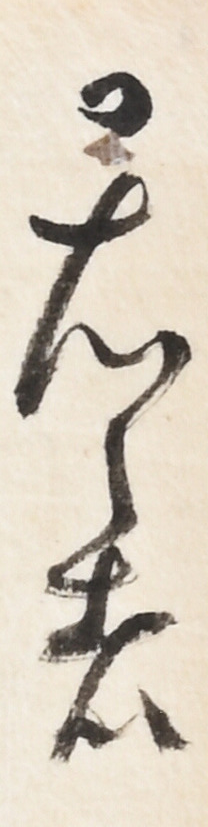〇右之者
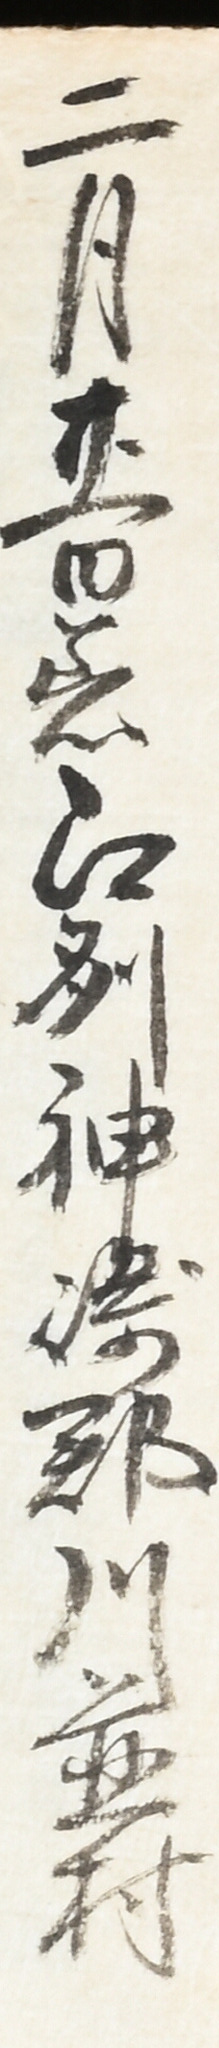弐月廿一日着江州蒲生郡石寺村
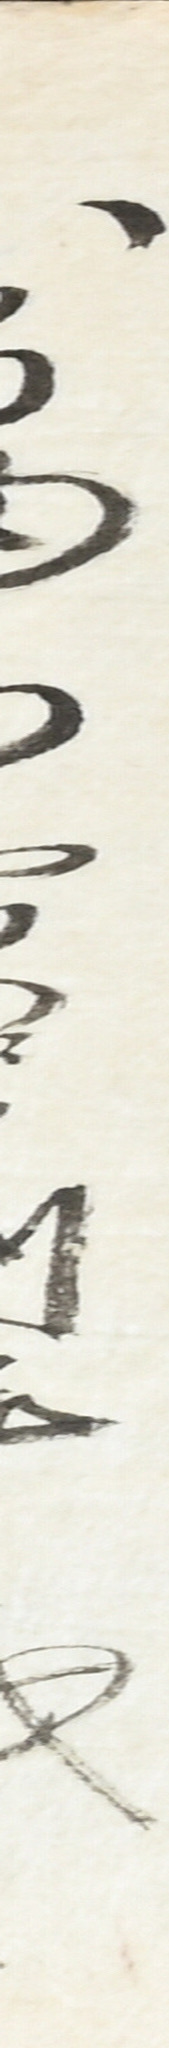小間物商売ニ而例年罷越申候

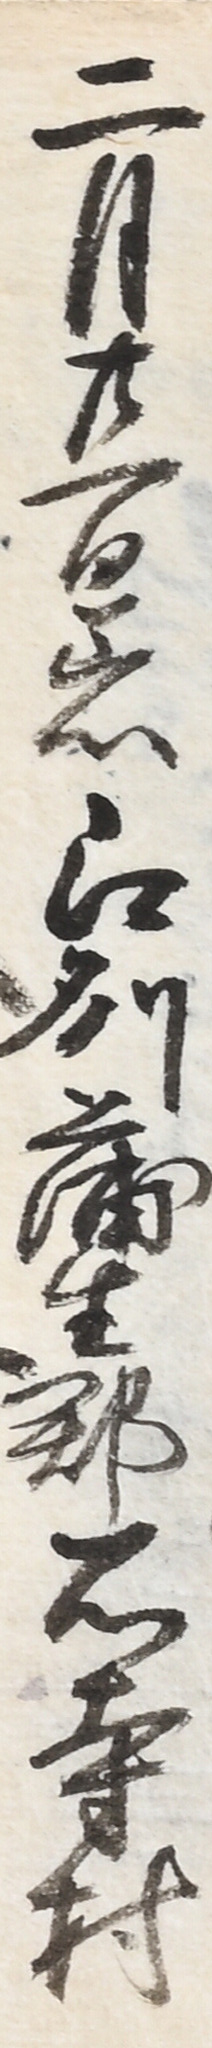二月廿一日着江州神崎郡川並村
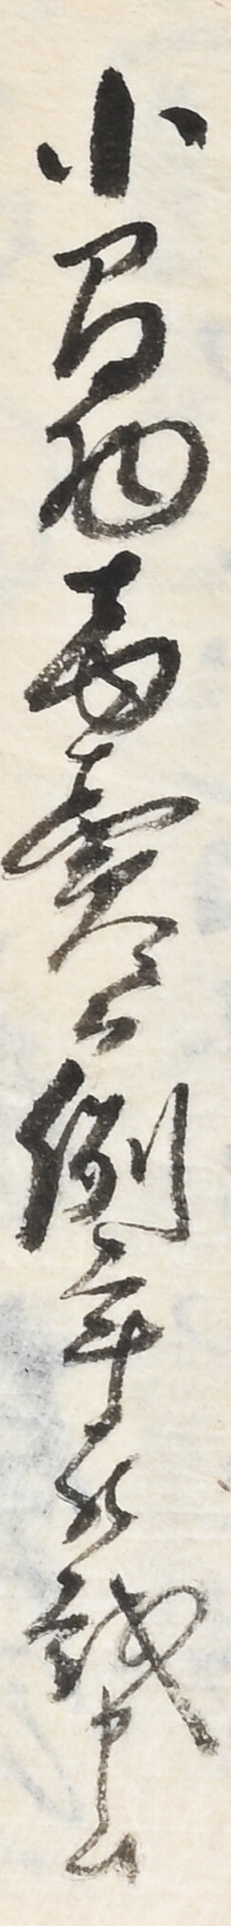小間物商売ニ而例年罷越申候
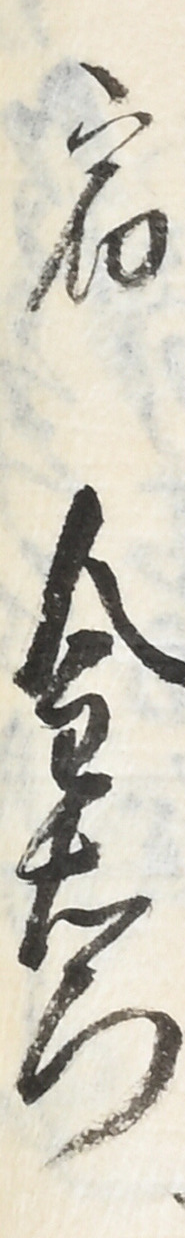宿常右衛門
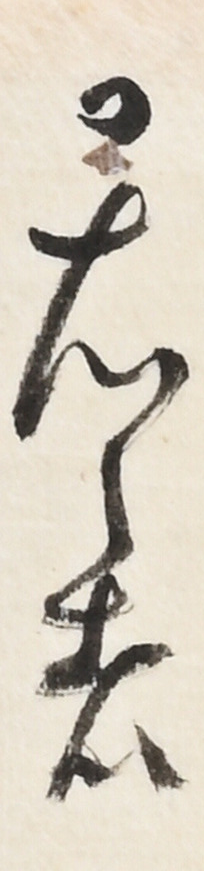〇右之者
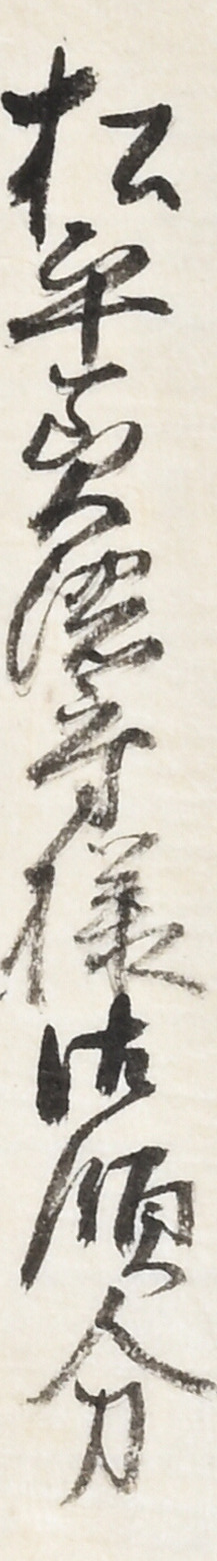間平美濃守様御領分
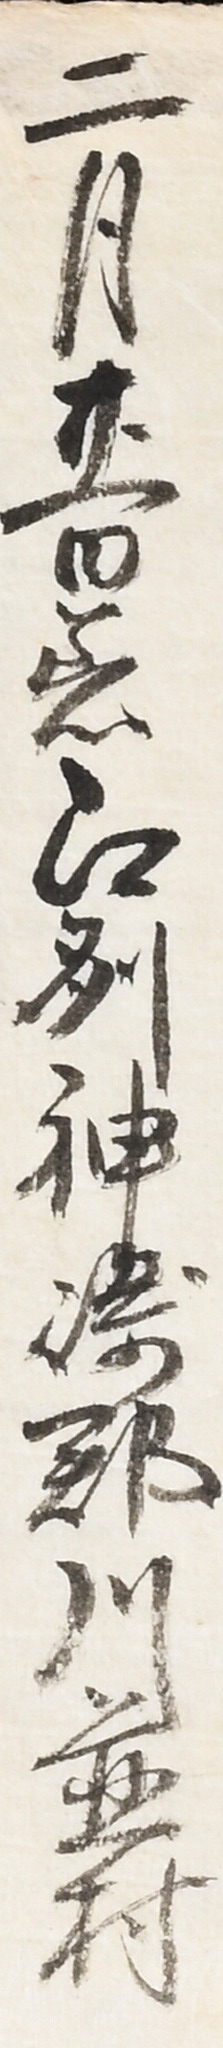二月廿一日着江州神崎郡川並村
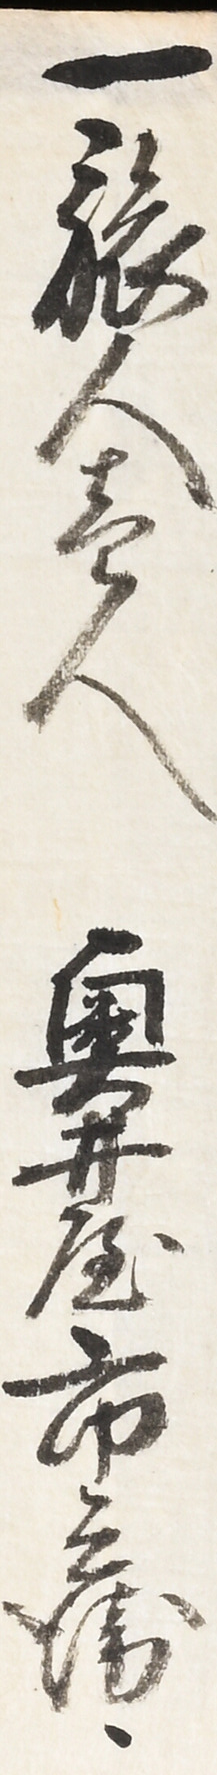一旅人壱人奥井屋市兵衛・
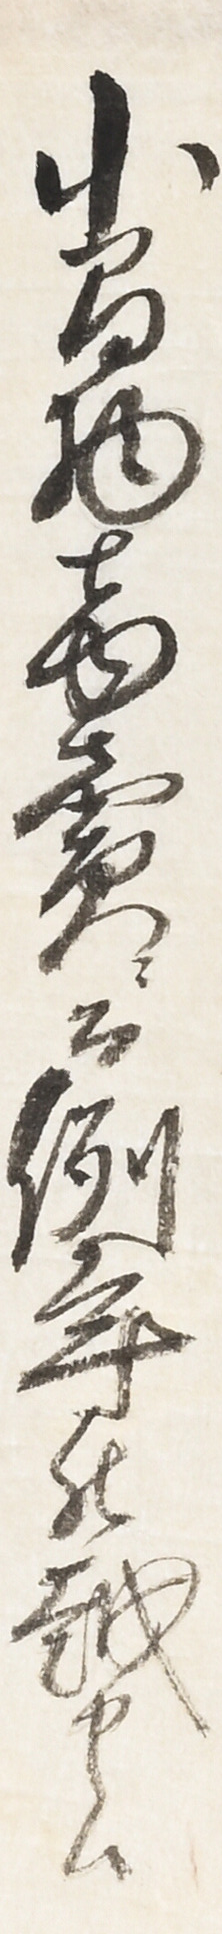小間物商売ニ而例年罷越申候
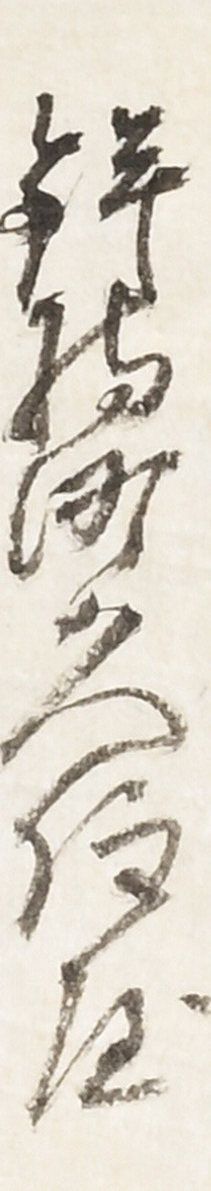鉾持町久住屋
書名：旅人泊控帳
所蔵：伊那市立高遠町図書館・合同会社AMANE
